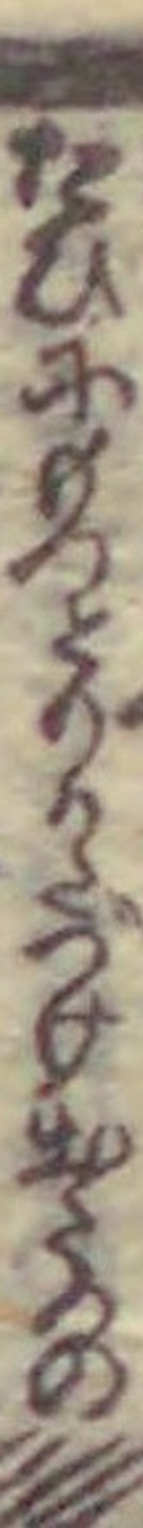たひにもつとりかたづけ出たつの
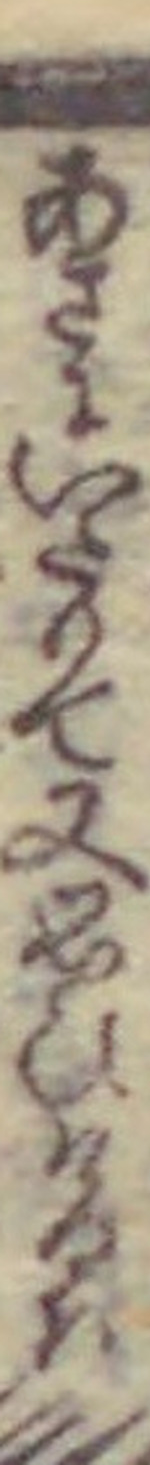あさにいたりて又思ひけるは
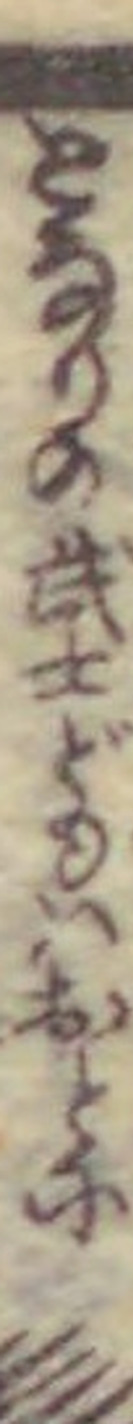となりの武士どもはおとに
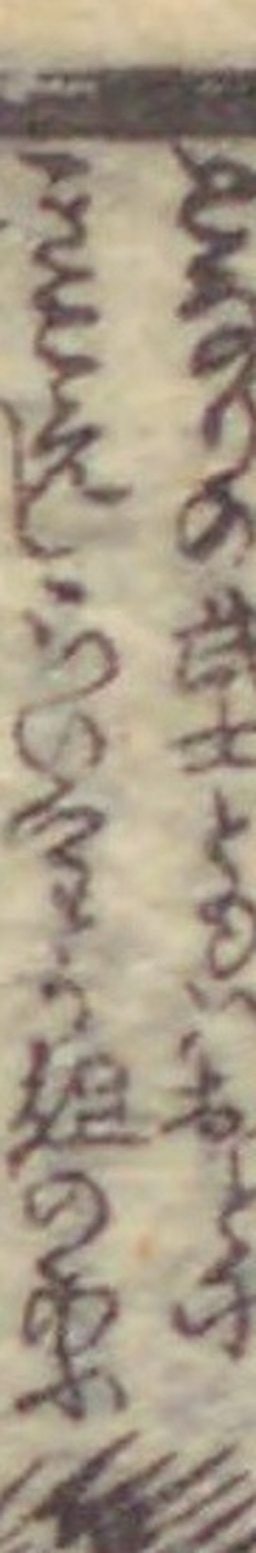きこえしらいくわう組のあふ
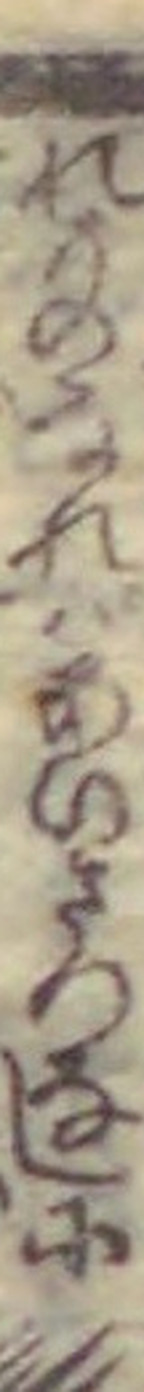れものなればあいさつなしに
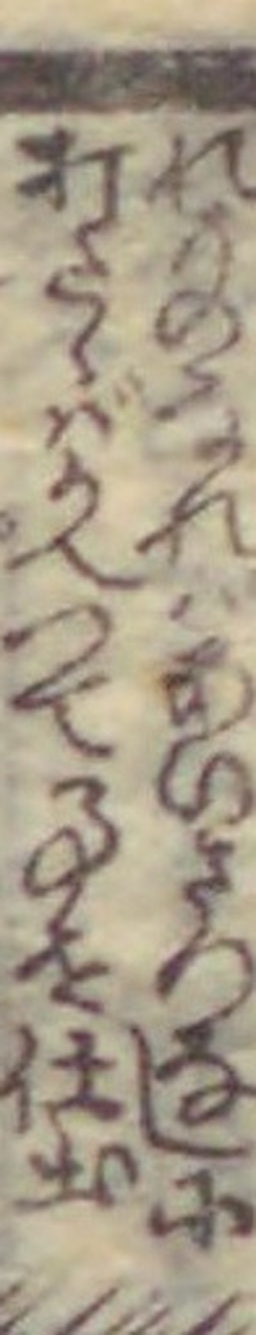打たゝばかへつて事を仕出
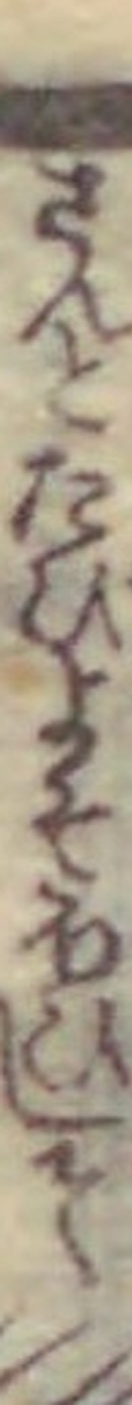さんとたびよそほひして
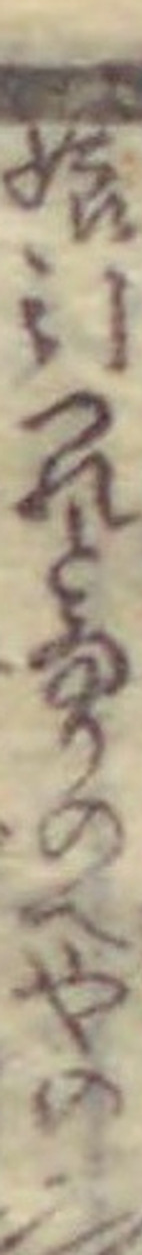娘引つれとなりのへやの
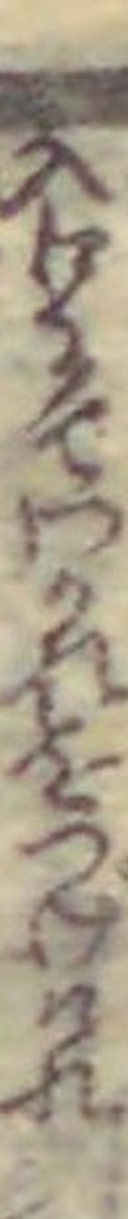入口にてわかれをつげけれ
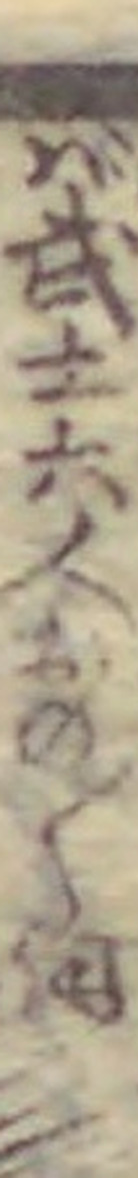ば武士六人おの〳〵
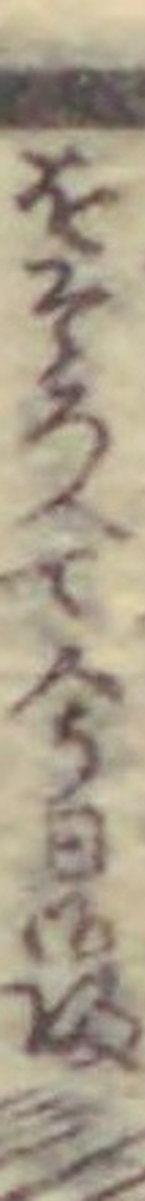をそろへて今日御帰
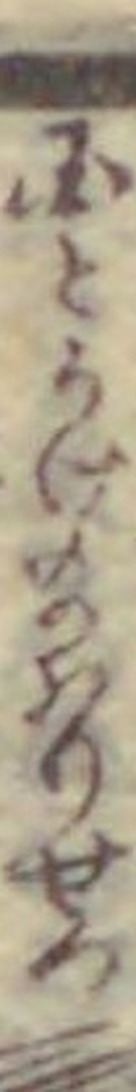国とうけ給はりせつ
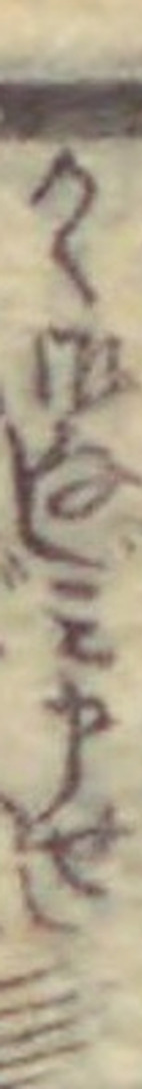かく御なじみ申せし
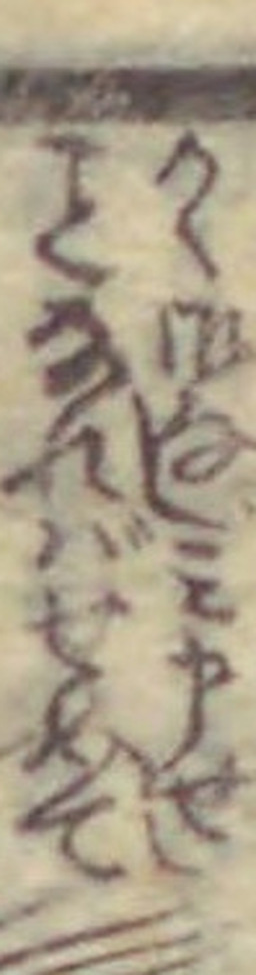ことなればせめて
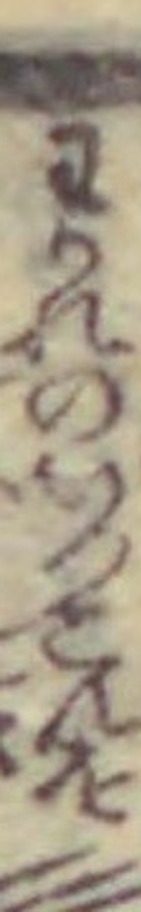わかれのいつこんを
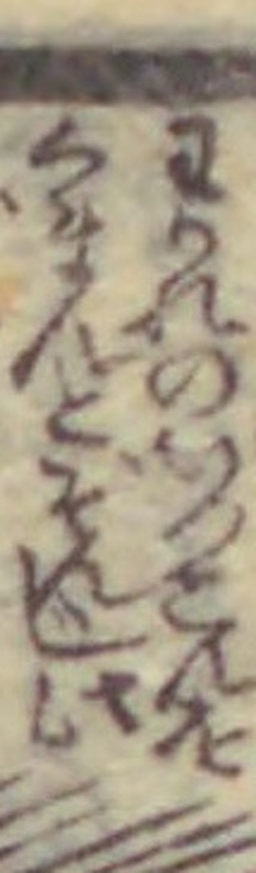くまんとぞんじ此
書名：八ツ目鱣因縁物語 3巻
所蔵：国立国会図書館 National Diet Library, JAPAN
